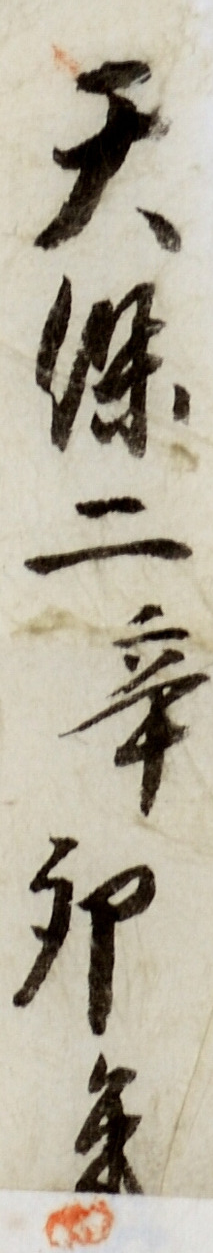天保二辛卯年
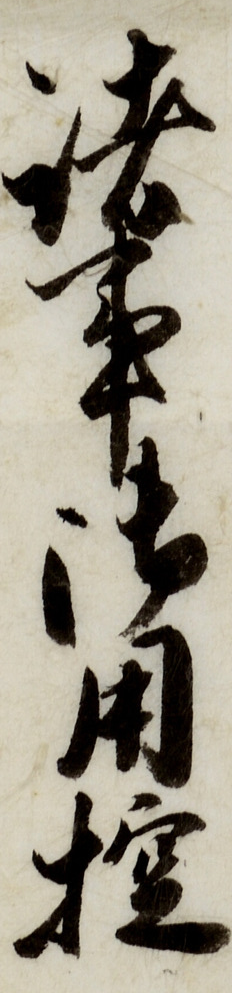諸事御用控
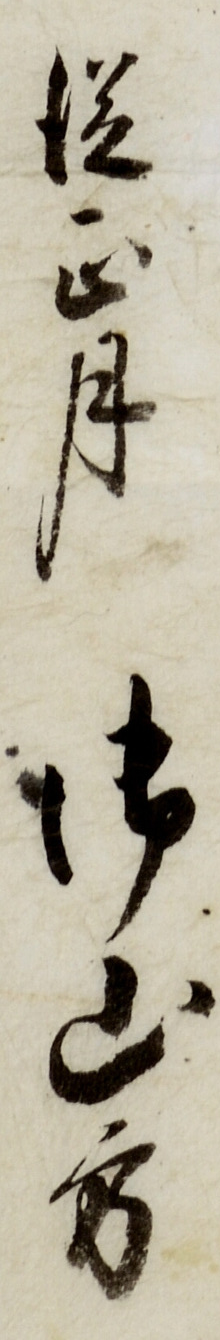従正月御山方
